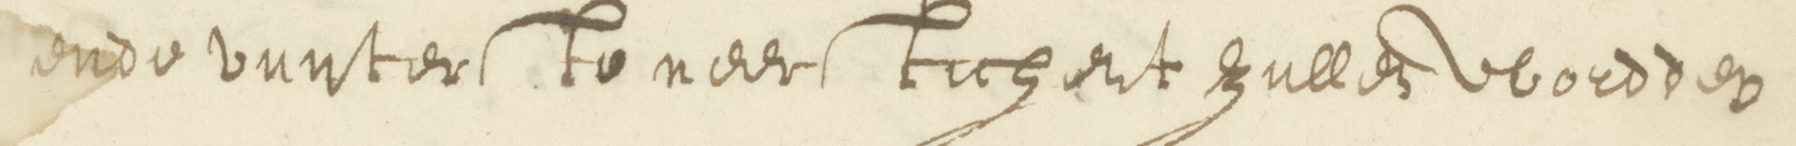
ende vuyterste neersticheyt zullen wordden
